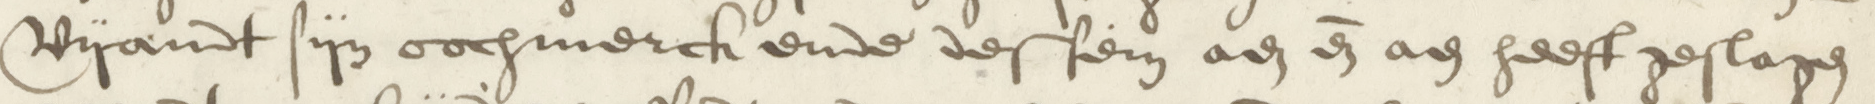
Vijandt sijn oochmerck ende dessein aen en aen heeft geslagen
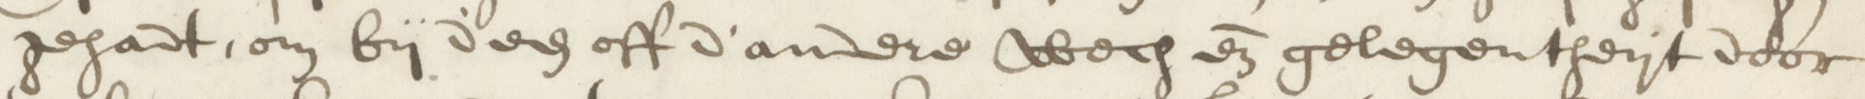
gehadt, om bij d'een off d'andere wech en gelegentheijt door
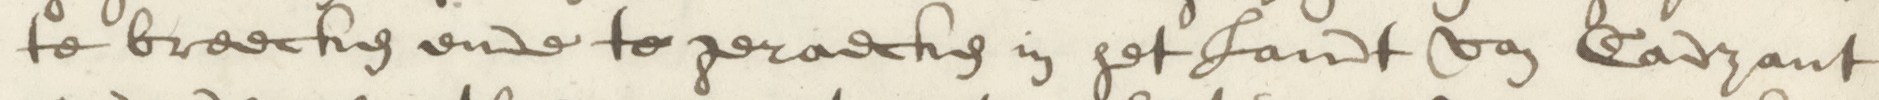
te breecken ende te geraecken in het Landt van Cadzant
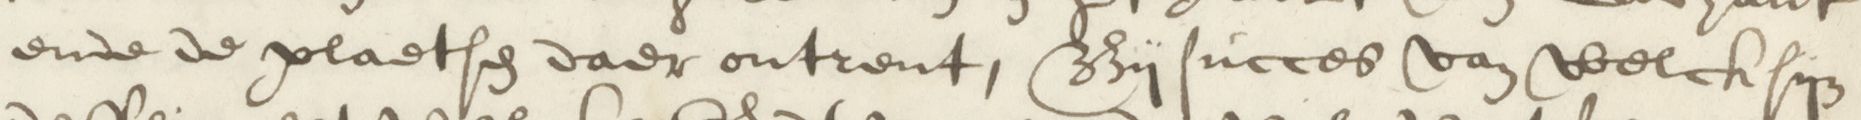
ende de plaetsen daer ontrent. Bij succes van welck sijn
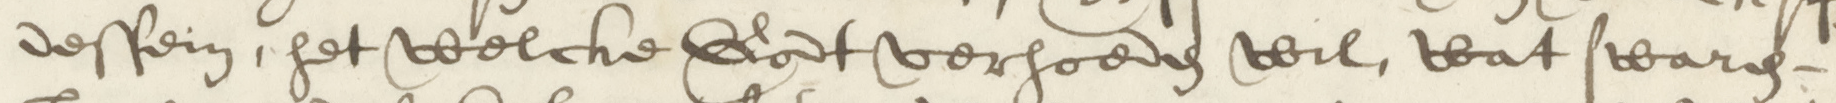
dessein, het welcke Godt verhoeden wil, wat swaren -
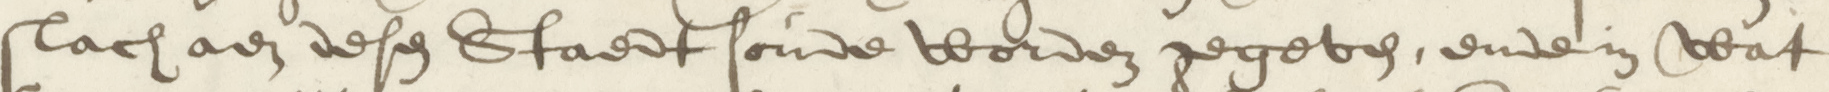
slach aen desen Staedt soude worden gegeven, ende in wat
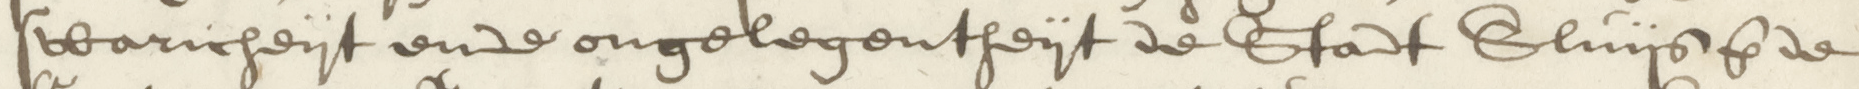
swaricheijt ende ongelegentheijt de Stadt Sluijs & de
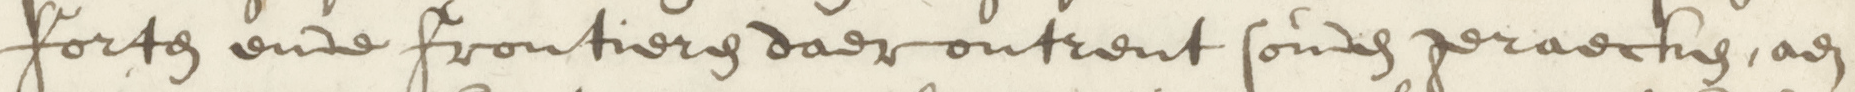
forten ende frontieren daer ontrent souden geraecken, aen
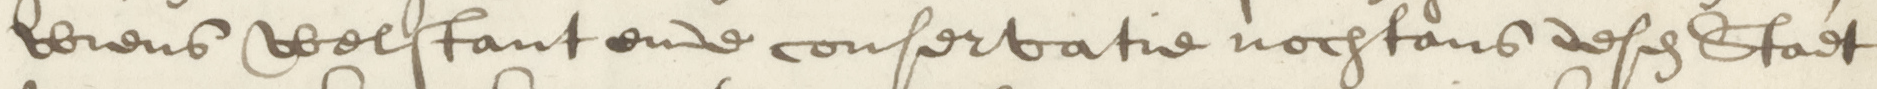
wiens welstant ende conservatie nochtans desen Staet
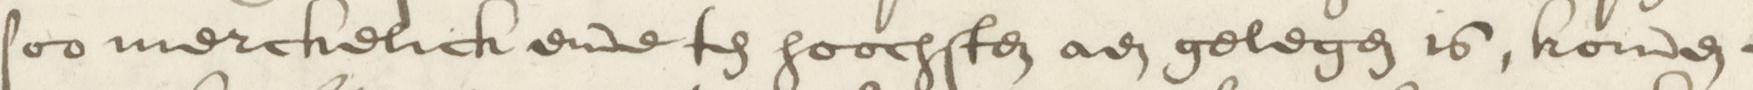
soo merckelick ende ten hoochsten aen gelegen is, konden
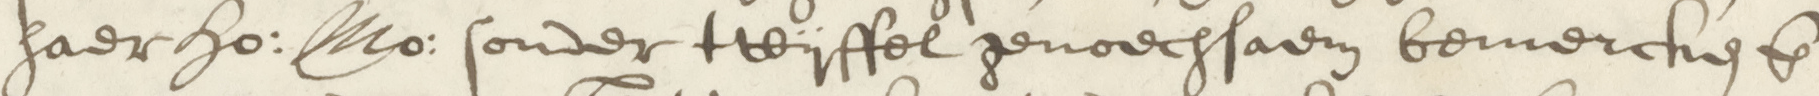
haer Ho:Mo: sonder twijffel genoechsaem bemercken &
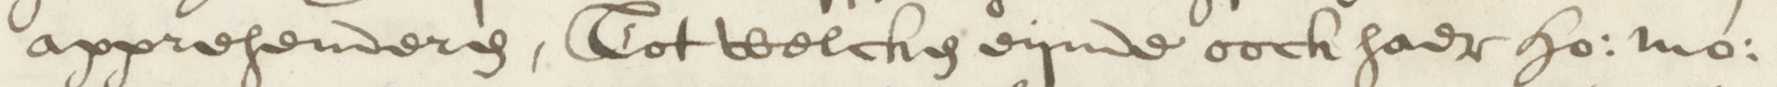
apprehenderen. Tot welcken eijnde oock haer Ho:Mo:
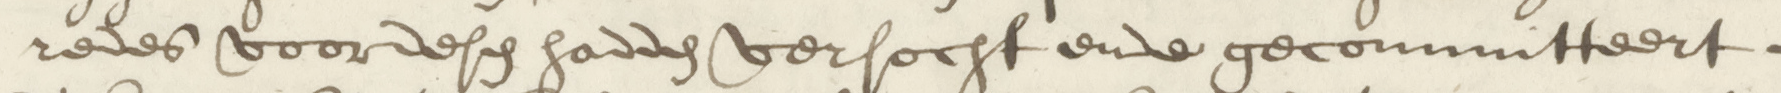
redes voordesen hadden versocht ende gecommitteert.
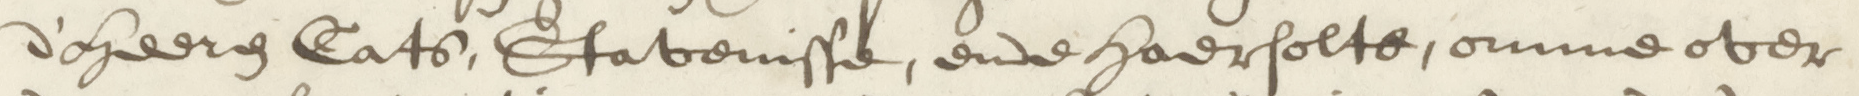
d'Heeren Cats, Stavenisse, ende Haersolte, omme over
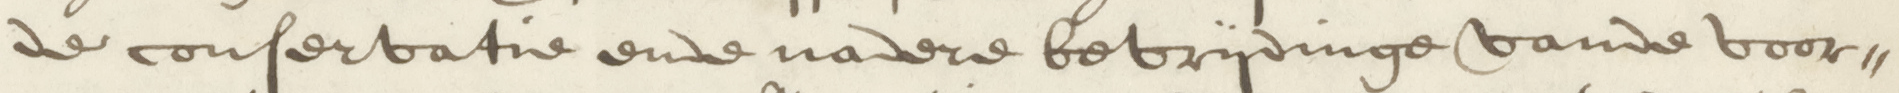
de conservatie ende nadere bevrijdinge vande voor„
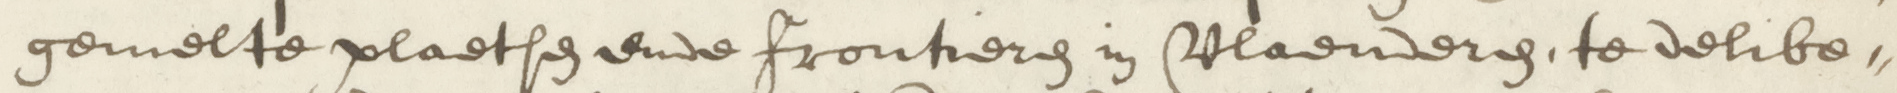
gemelte plaetsen ende frontieren in Vlaenderen, te delibe„
